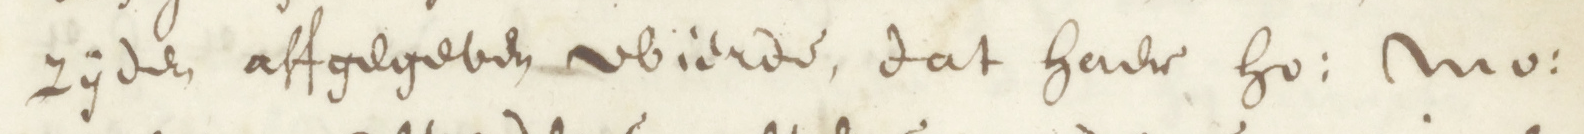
zijden affgegeven wierde, dat haer ho:mo:
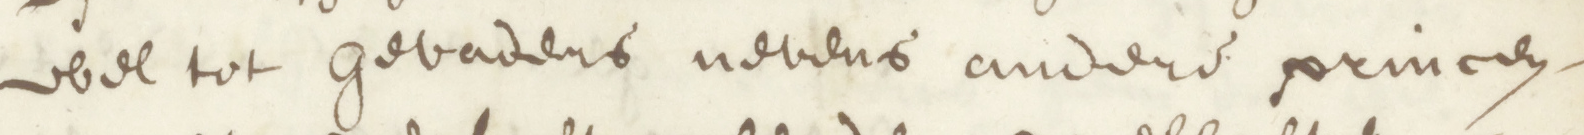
wel tot gevaders nevens andere princen
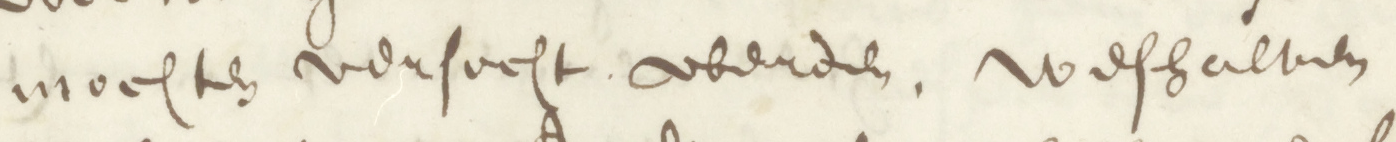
mochten versocht werden, weshalven
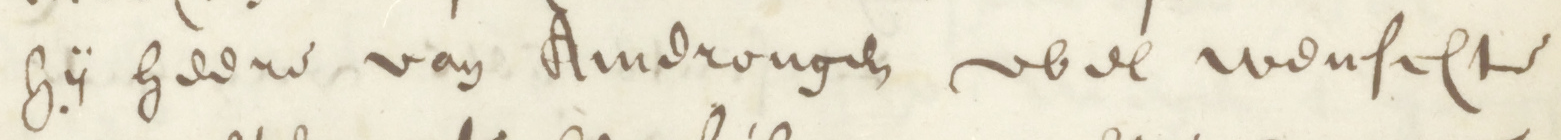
hij heere van Amerongen wel wenschte
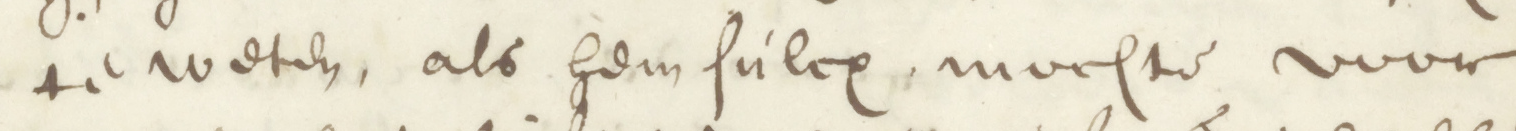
te weten, als hem sulcx, mochte voor
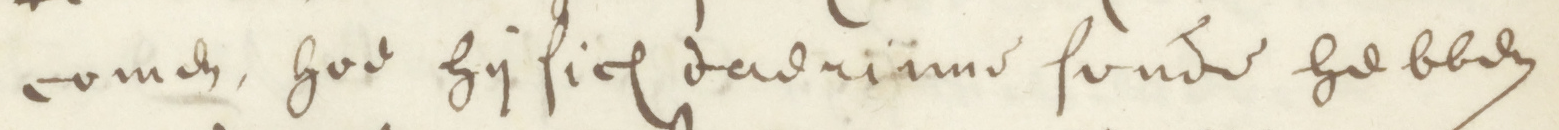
comen, hoe hij sich daerinne soude hebben
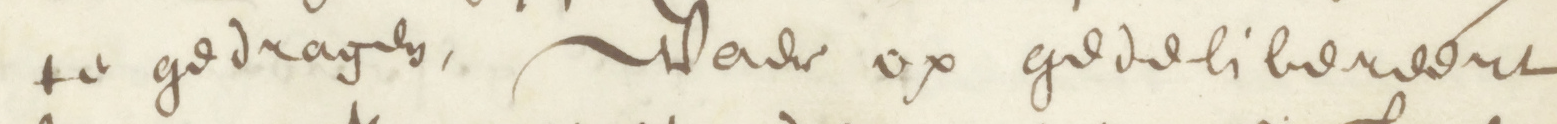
te gedragen. Waer op gedelibereert
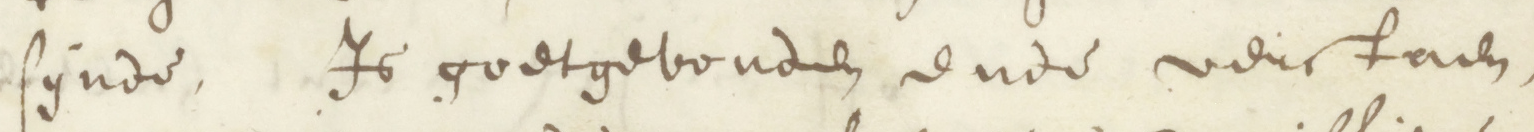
sijnde, is goetgevonden ende verstaen
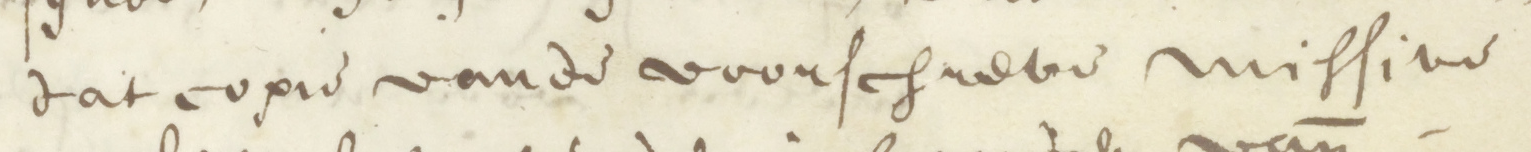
dat copie vande voorschreve missive
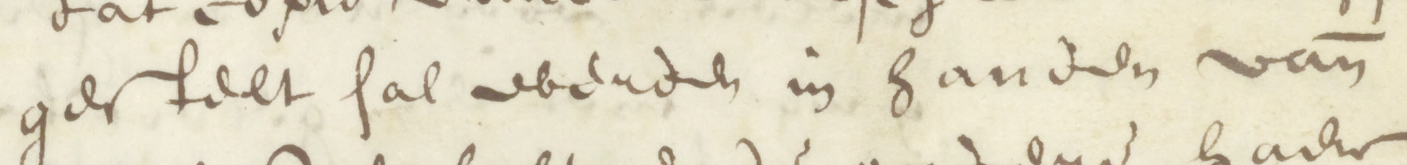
gestelt sal werden in handen van
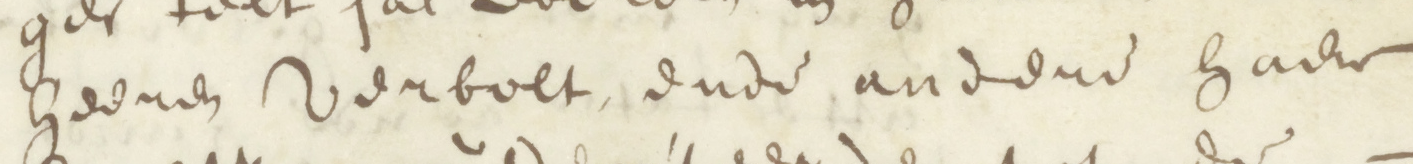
heeren Verbolt, ende andere haer
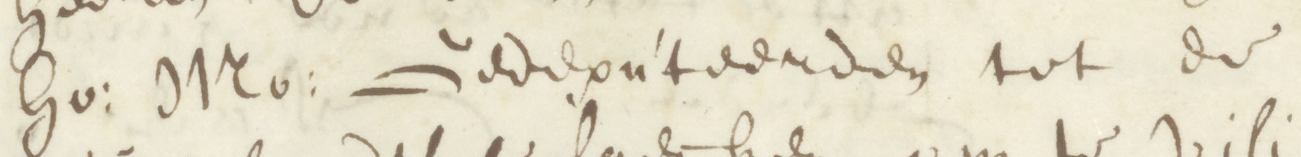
ho:Mo: Gedeputeerden tot de
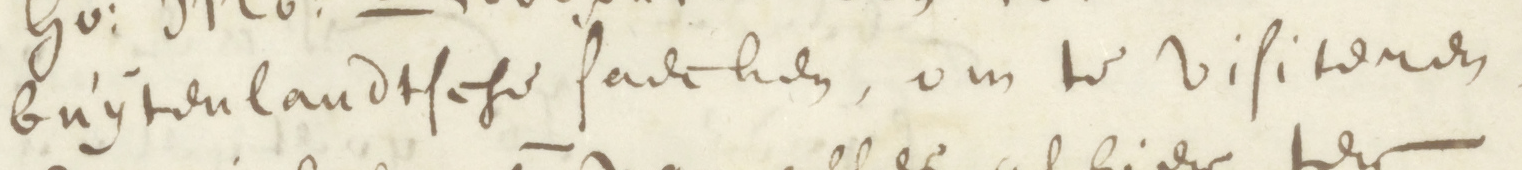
buijtenlandtsche saecken, om te visiteren,
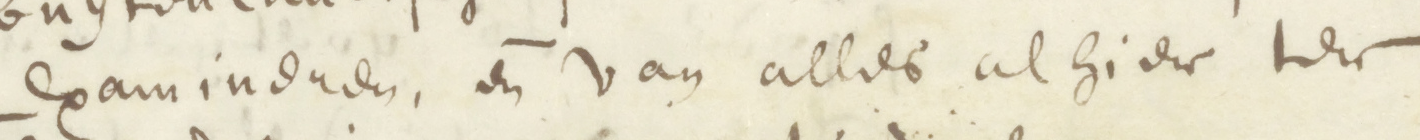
examineren, en van alles alhier ter
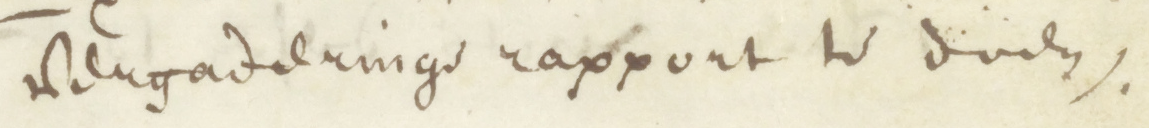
vergaderinge rapport te doen.
